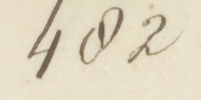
482
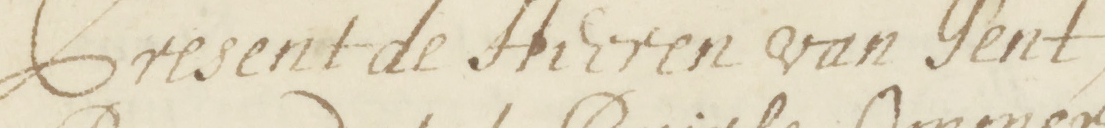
Present de Heeren van Gent,
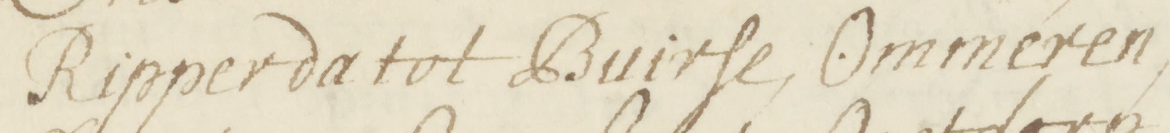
Ripperda tot Buirse, Ommeren
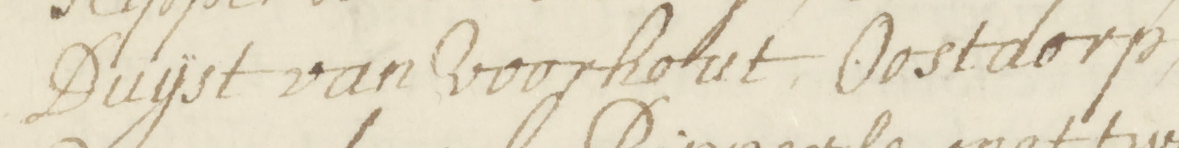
Duijst van Voorhout, Oostdorp,
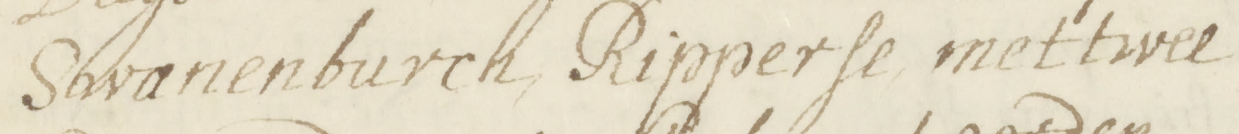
Swanenburch, Ripperse, met twee
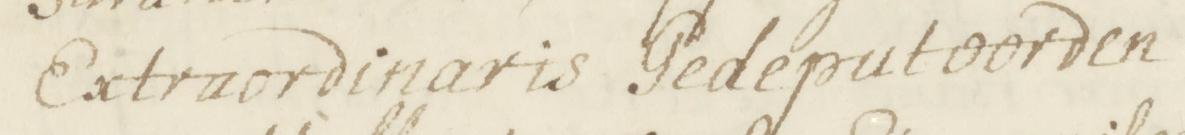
Extraordinaris Gedeputeerden
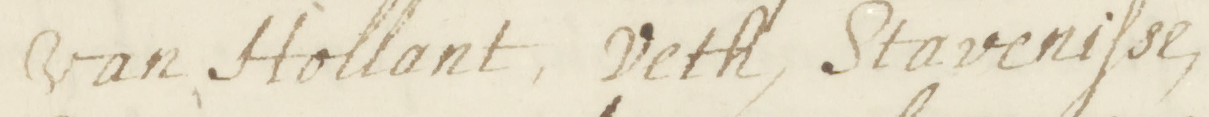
van Hollant, Veth, Stavenisse,
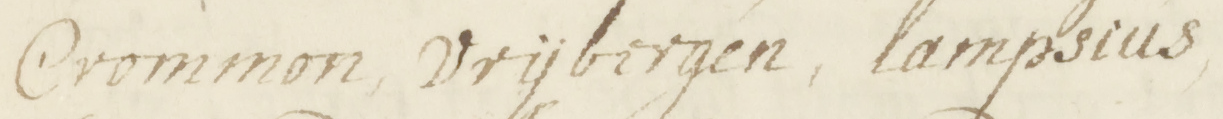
Crommon, Vrijbergen lampsius
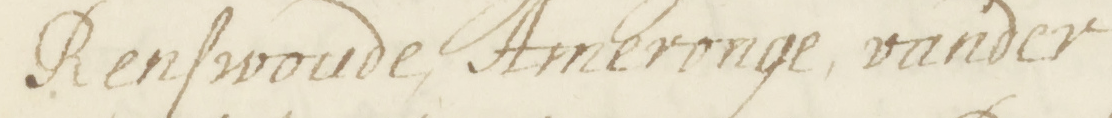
Renswoude, Ameronge, vander
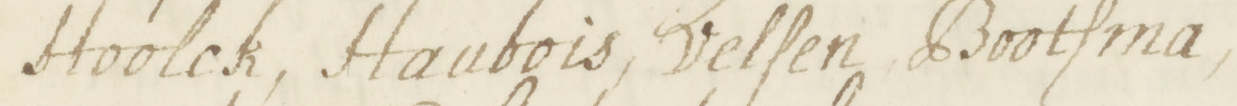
Hoolck, Haubois, Velsen, Bootsma,
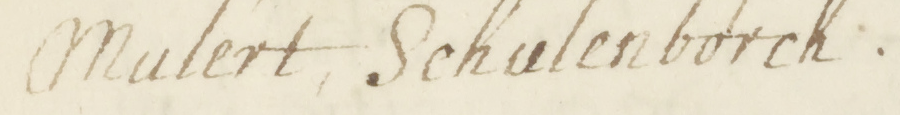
Mulert, Schulenborch.
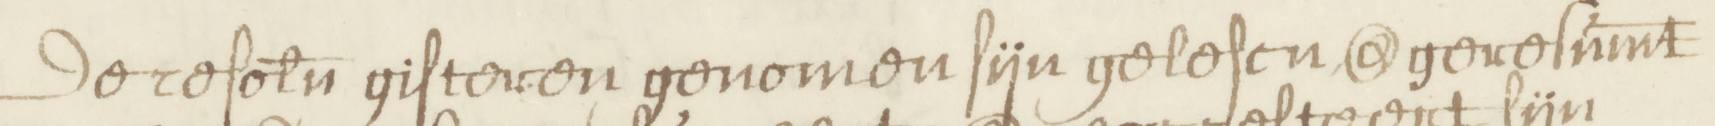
De resoln gisteren genomen sijn gelesen & geresumt.
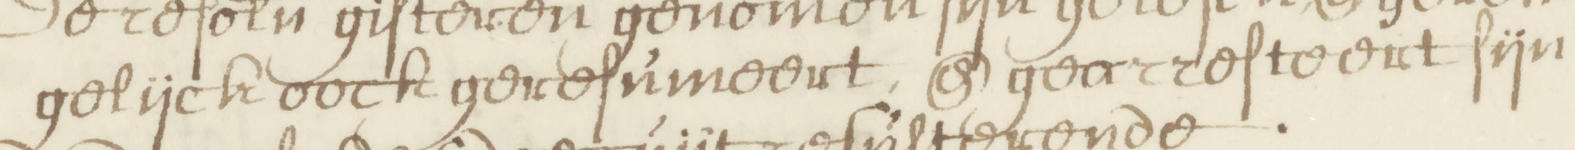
gelijck oock geresumeert, & gearresteert sijn
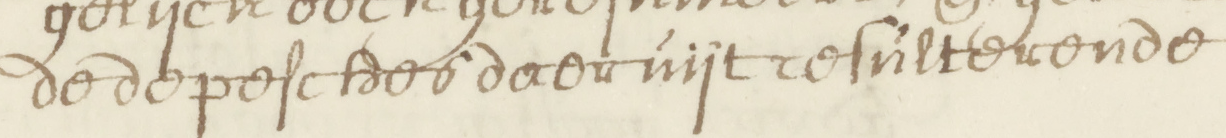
de depesches daeruijt resulterende.
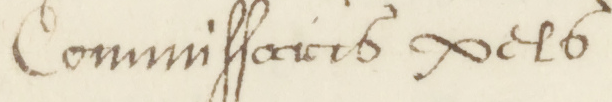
Commissaris pels
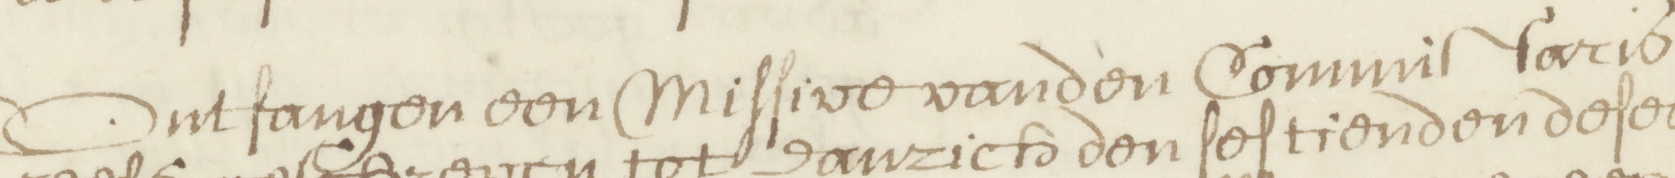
Ontfangen een Missive vanden Commissaris
